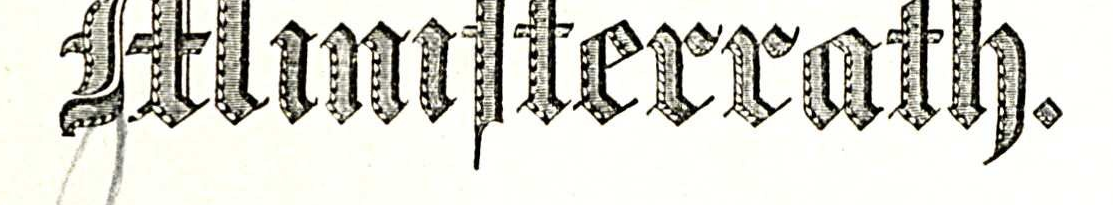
Ministerrath
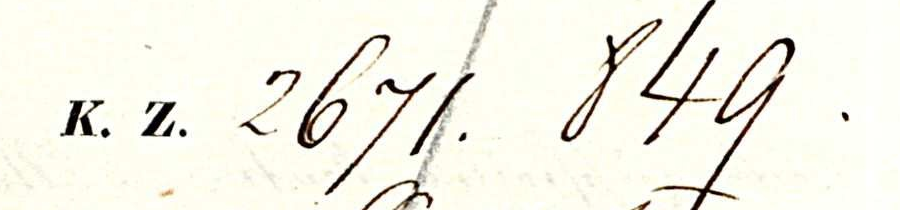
KZ 2671 [1]849
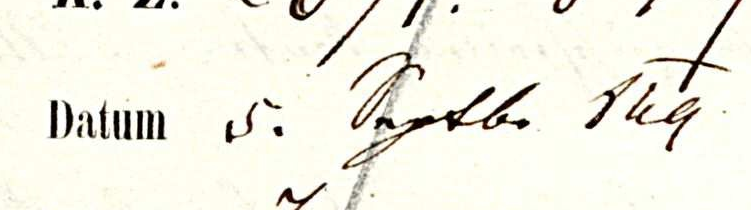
Datum 5. Septbr. 1849
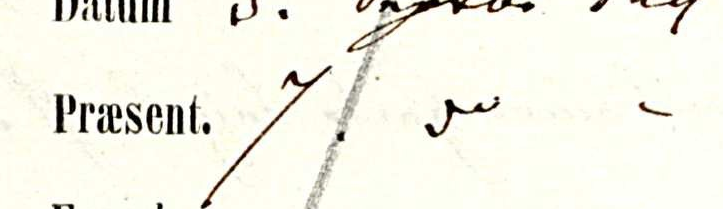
Praesent 7. „ „
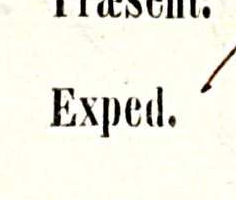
Exped.
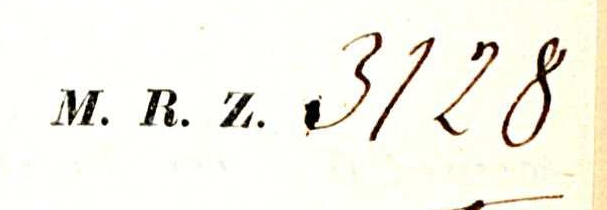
MRZ 3128
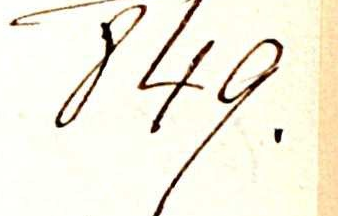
849
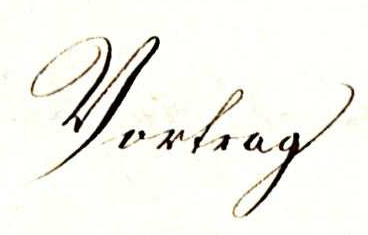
Vortrag
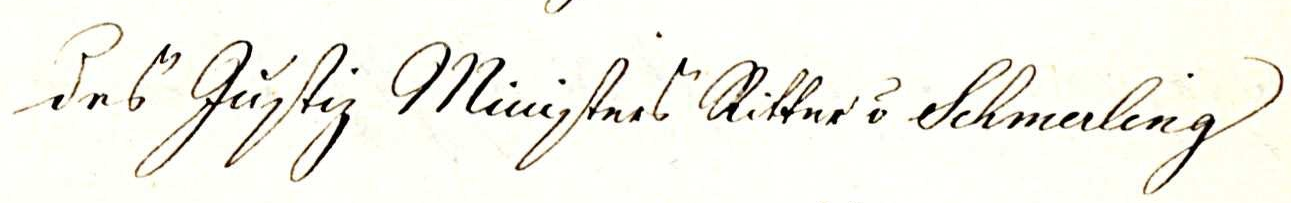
des Justiz-Ministers Ritter v. Schmerling
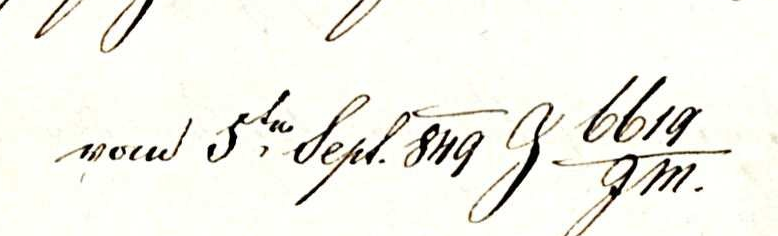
vom 5te Sept. 849 Z 6619/
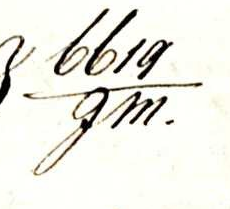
JM.
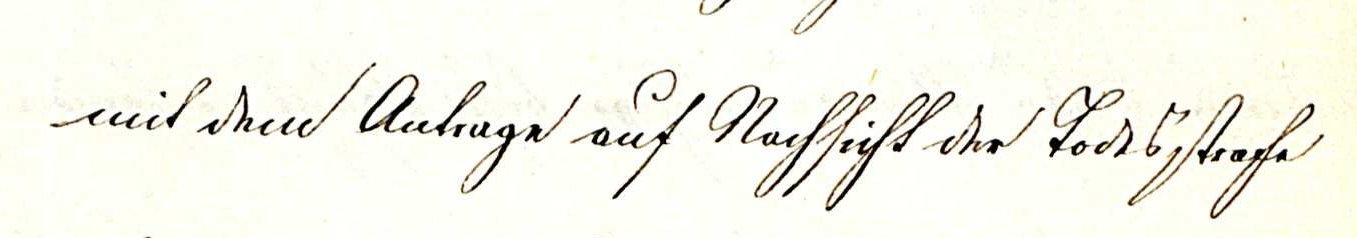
mit dem Antrage auf Nachsicht der Todesstrafe
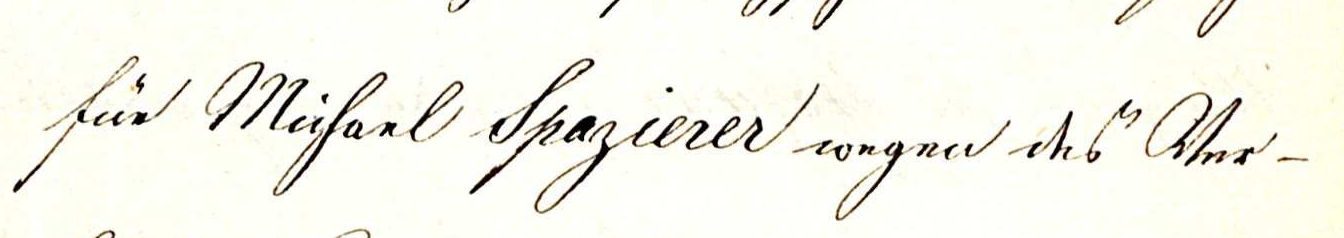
für Michael Spazierer wegen des Ver¬
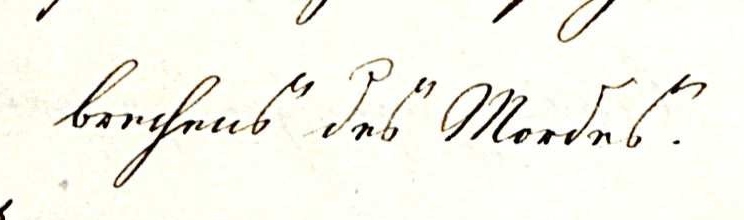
brechens des Mordes.
